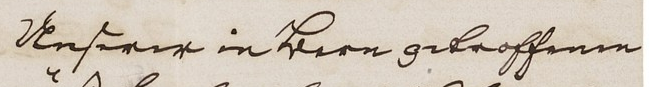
Unserer in Bern getroffenen
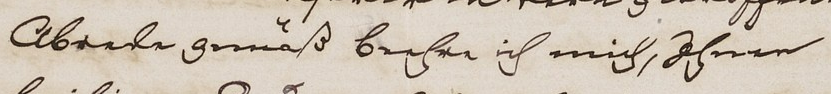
Abrede gemäß beehre ich mich, Ihnen
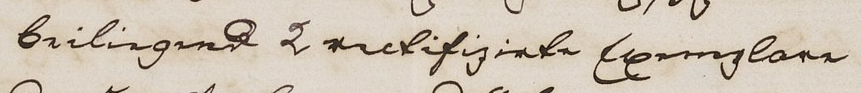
beiliegend 2 rectifizirte Exemplare
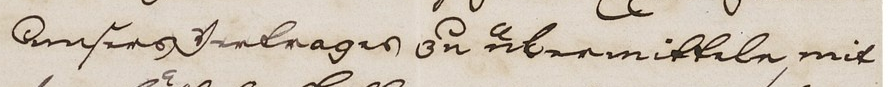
unsers Vertrages zu übermitteln, mit
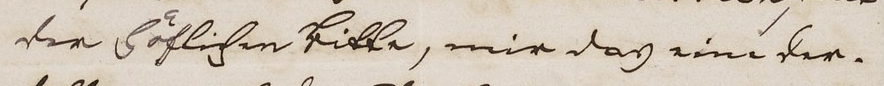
der höflichen Bitte, mir das eine der-
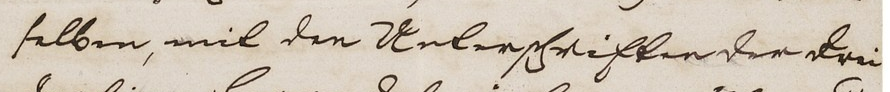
selben, mit den Unterschriften der drei
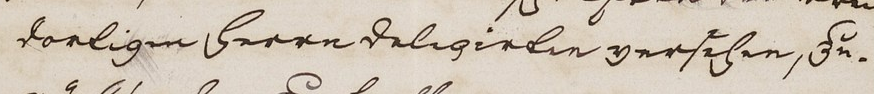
dortigen Herrn Delegirten versehen, zu-
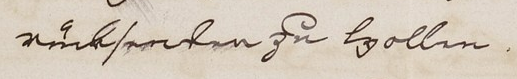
rücksenden zu wollen.
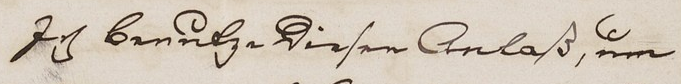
Ich benutze diesen Anlaß, um
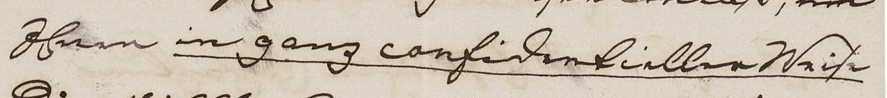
Ihnen in ganz confidentieller Weise
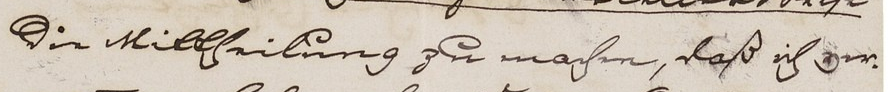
die Mittheilung zu machen, daß ich ver-
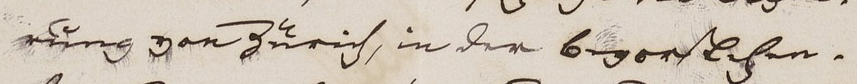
rung von Zürich, in der bevorstehen-
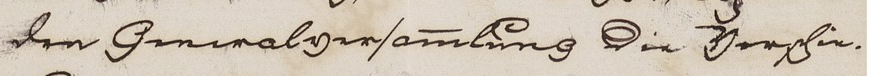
den Generalversammlung die Verschie-
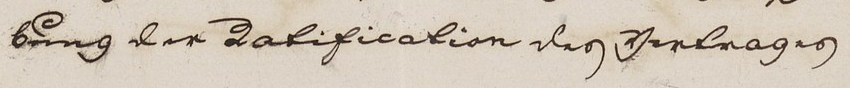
bung der Ratification des Vertrages
